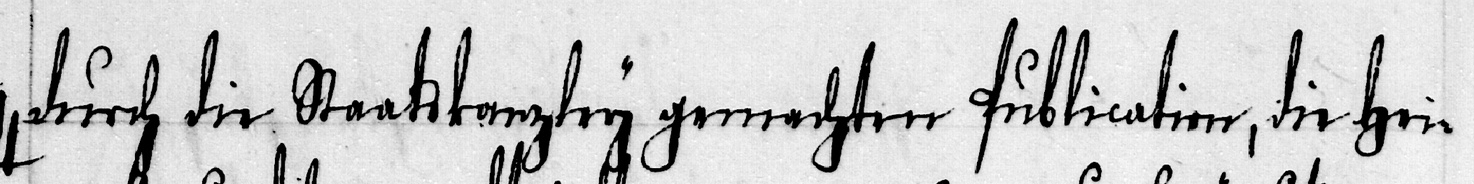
durch die Staatskanzley gemachten Publication, die He¬
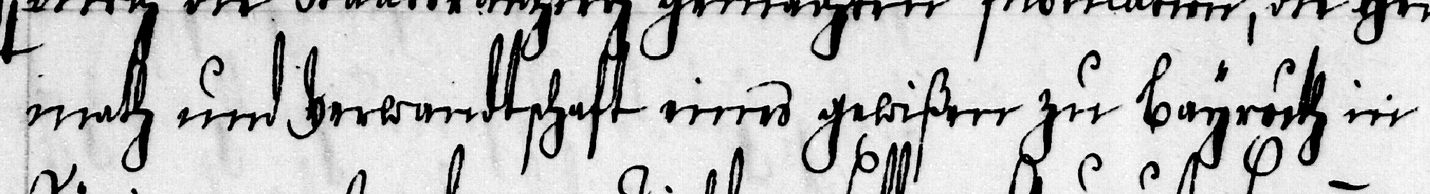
imath und Verwandtschaft eines gewißen zu Bayruth in
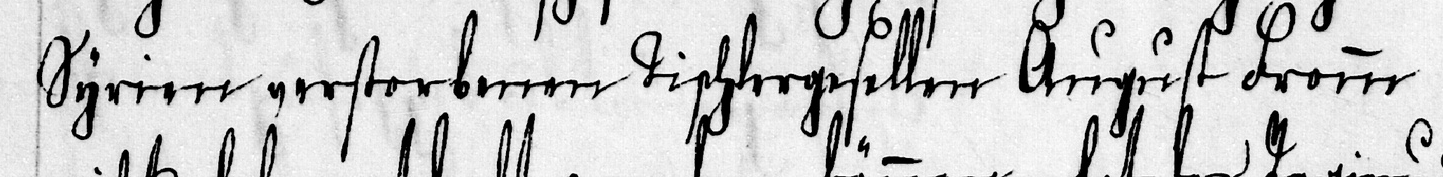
Syrien verstorbenen Tischlergesellen August Fromm
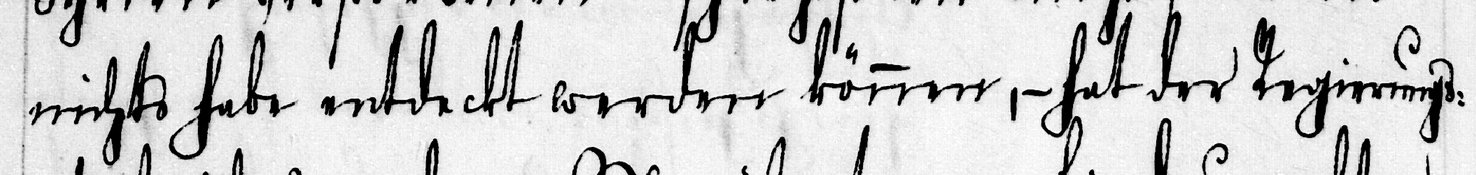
nichts habe entdeckt werden können, – hat der Regierung¬
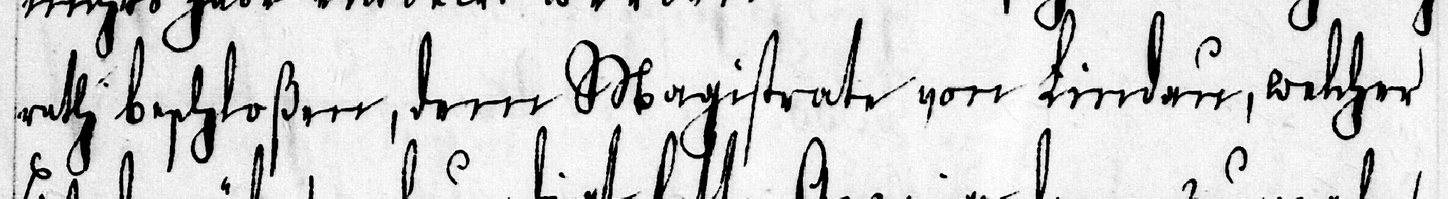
rath beschloßen, dem Magistrate von Lindau, welcher
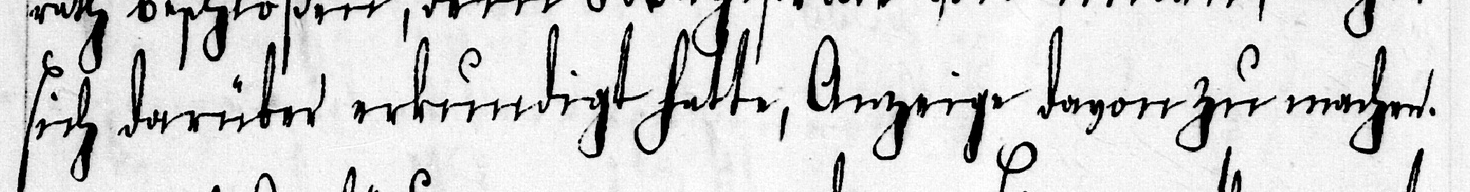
sich darüber erkundigt hatte, Anzeige davon zu machen.
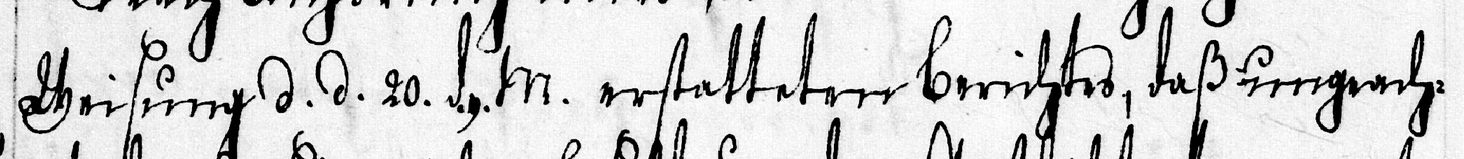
Weisung d. d. 20. d. v. M. erstatteten Berichtes, daß ungeach¬
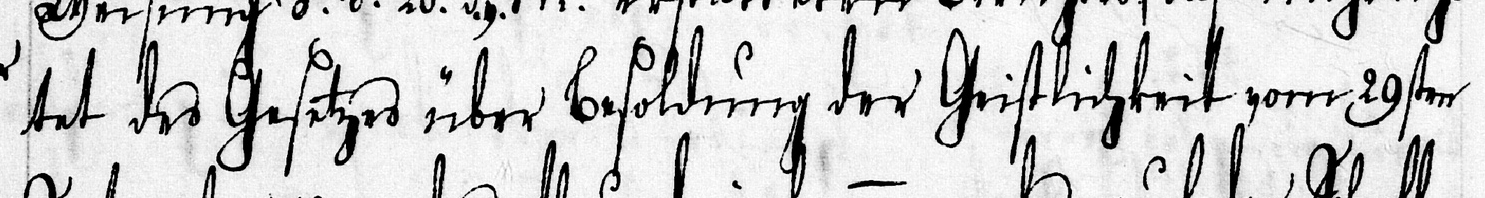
tet des Gesetzes über Besoldung der Geistlichkeit vom 29ten
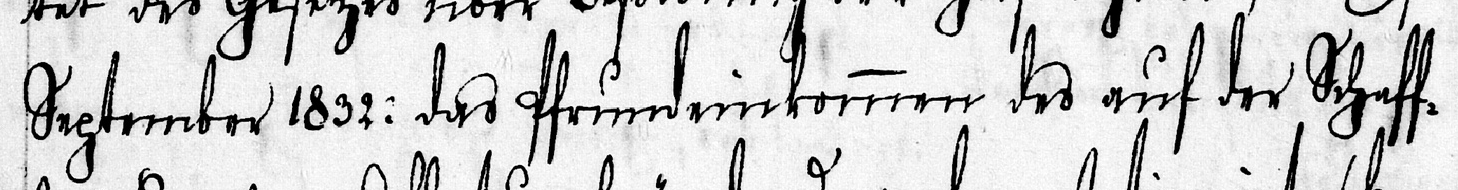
September 1832. das Pfrundeinkommen des auf der Schaff¬
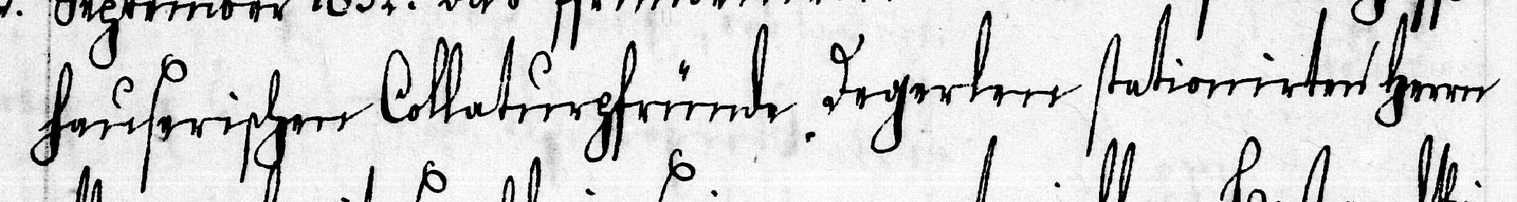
hauserischen Collaturpfründe Degerlen stationirten Herrn
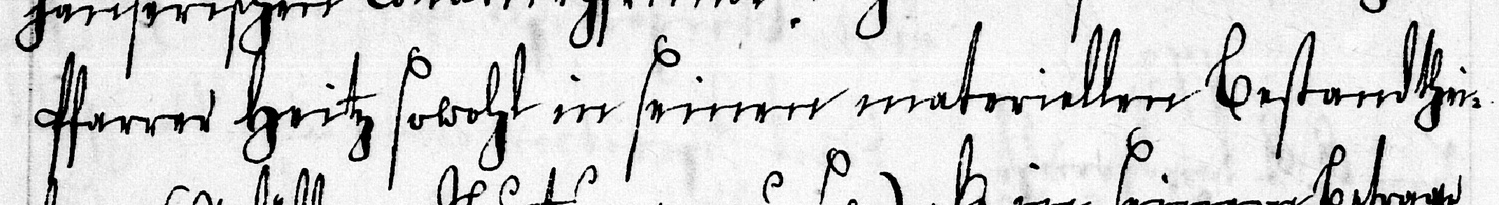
Pfarrer Heitz sowohl in seinen materiellen Bestandthei¬
